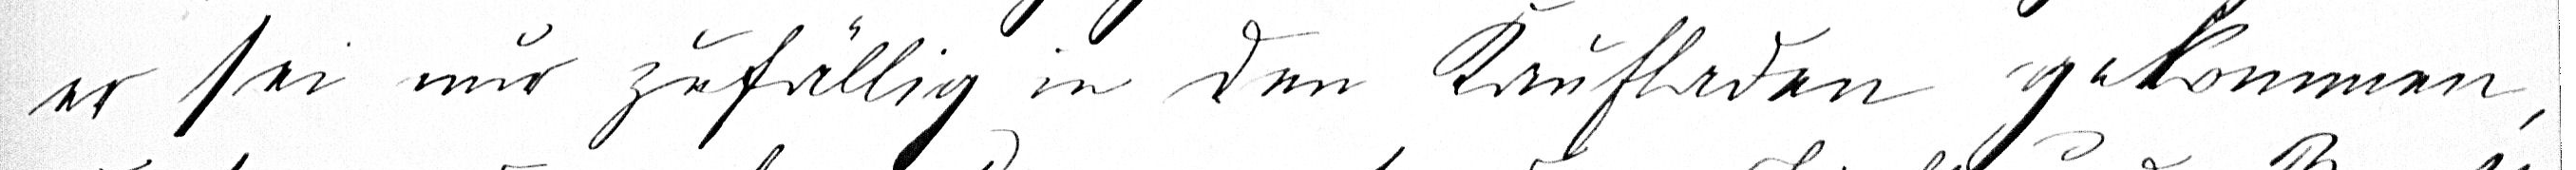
er sei nur zufällig in den Kaufladen gekommen,
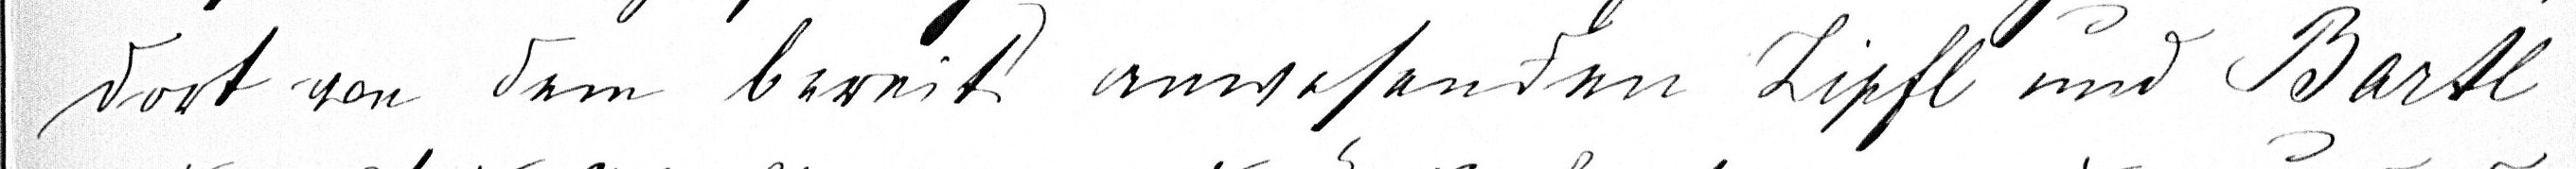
dort von dem bereit anwesenden Lipfl und Bartl
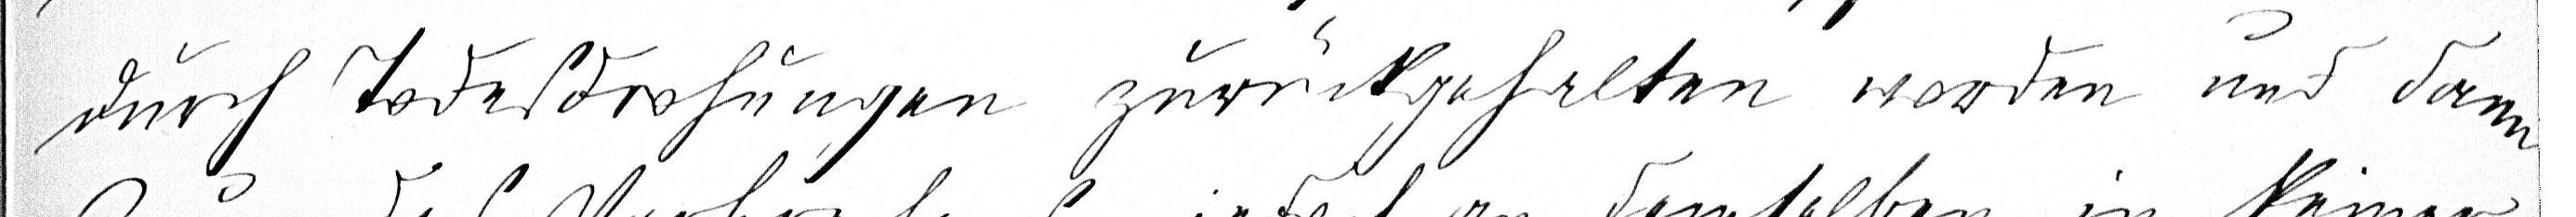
durch Todesdrohungen zurückgehalten worden und dann
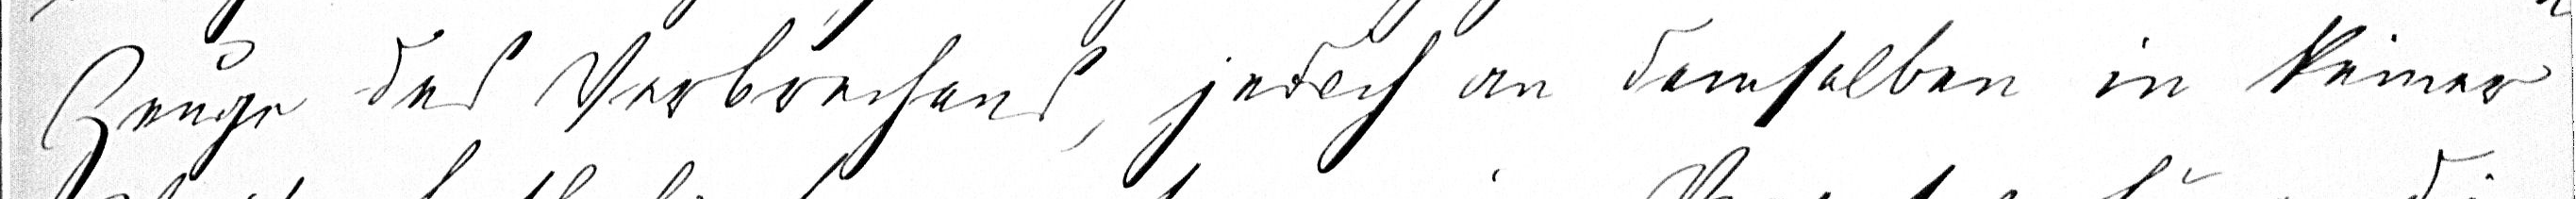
Zeuge des Verbrechens, jedoch an demselben in keiner
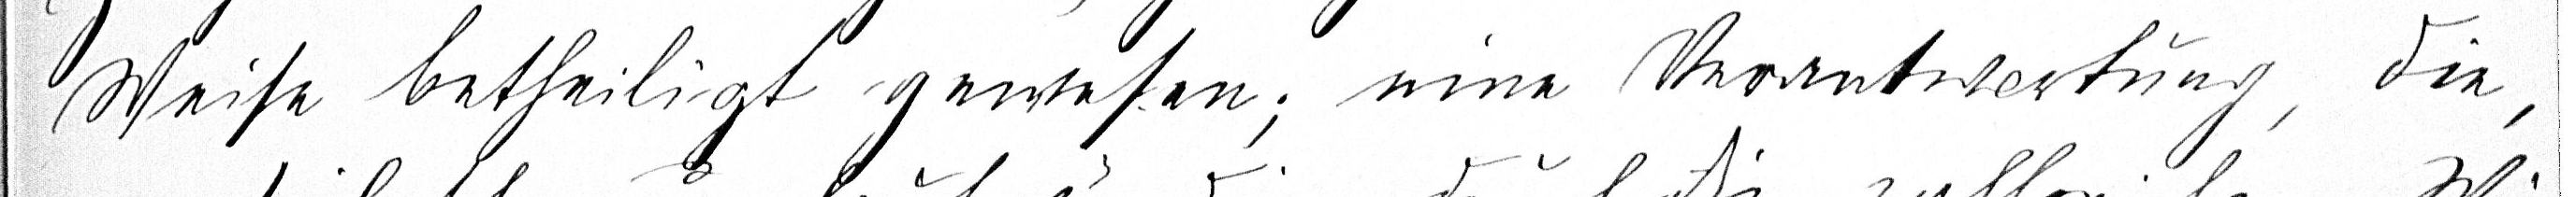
Weise betheiligt gewesen; eine Verantwortung, die,
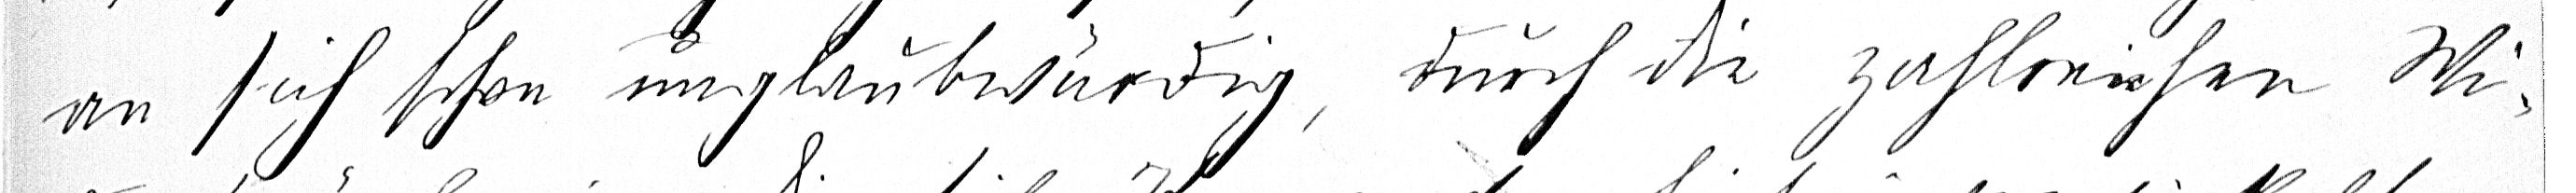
an sich schon unglaubwürdig, durch die zahlreichen Wi¬
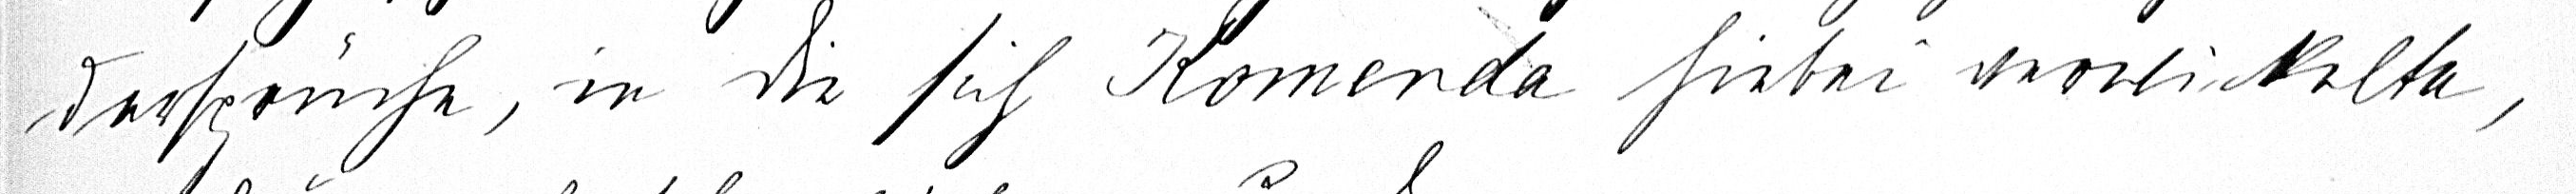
dersprüche, in die sich Komenda hiebei verwickelte,
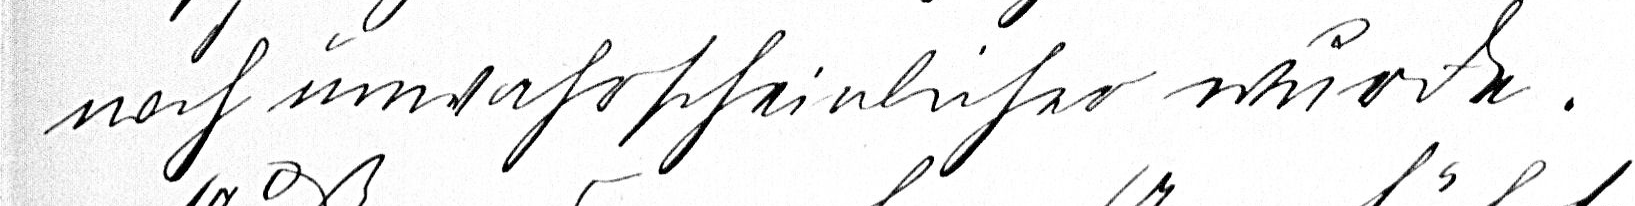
noch unwahrscheinlicher wurde.
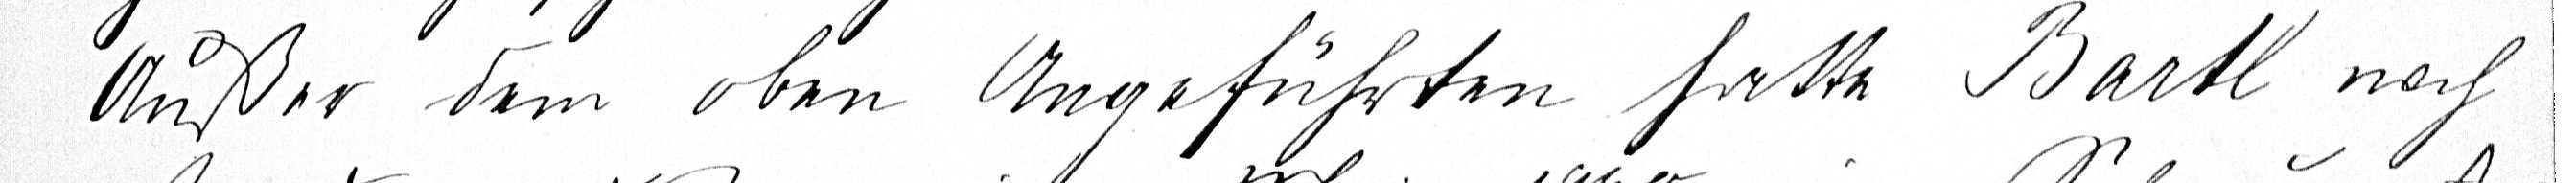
Außer dem oben Angeführten hatte Bartl noch
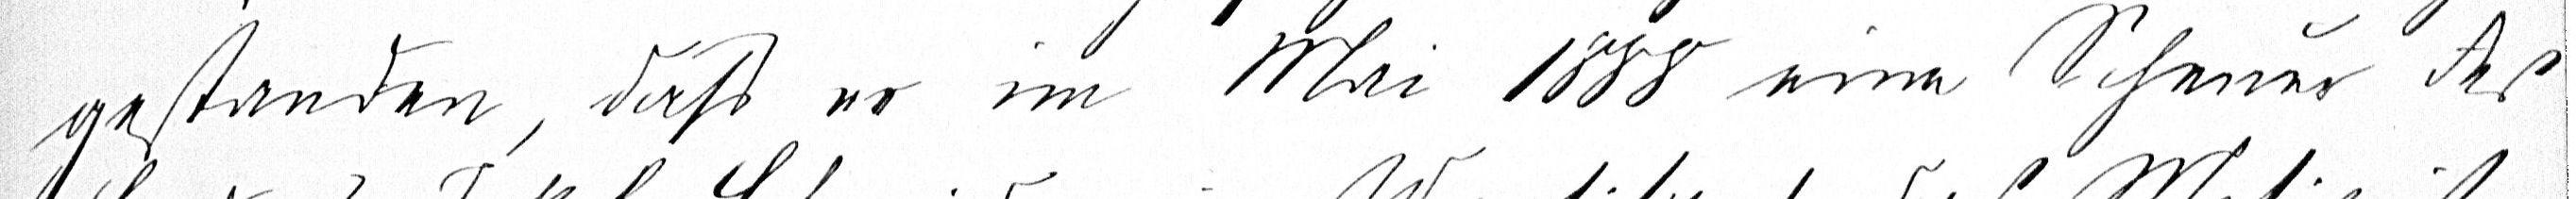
gestanden, daß er im Mai 1888 eine Scheuer des
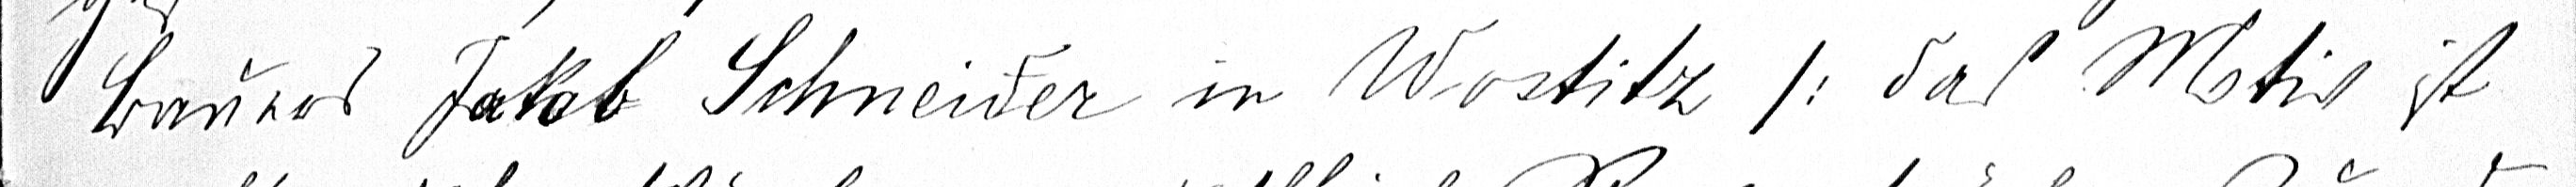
Baueres Jakob Schneider in Wostitz /: das Motiv ist
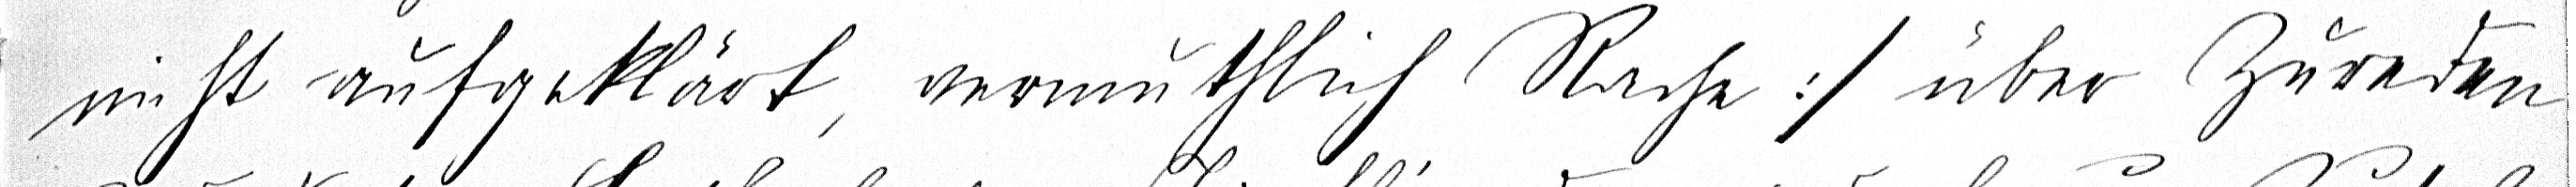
nicht aufgeklärt, vermuthlich Rache :/ über Zureden
